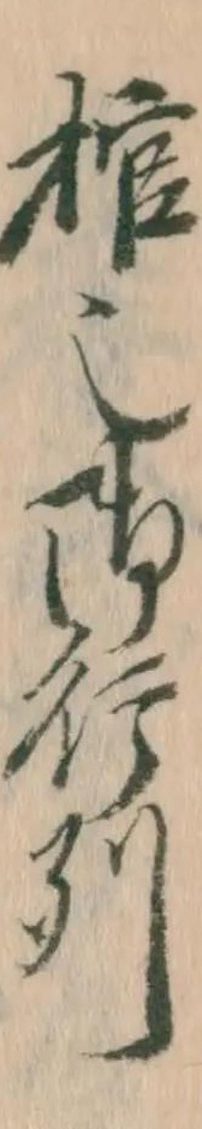棺也御行列
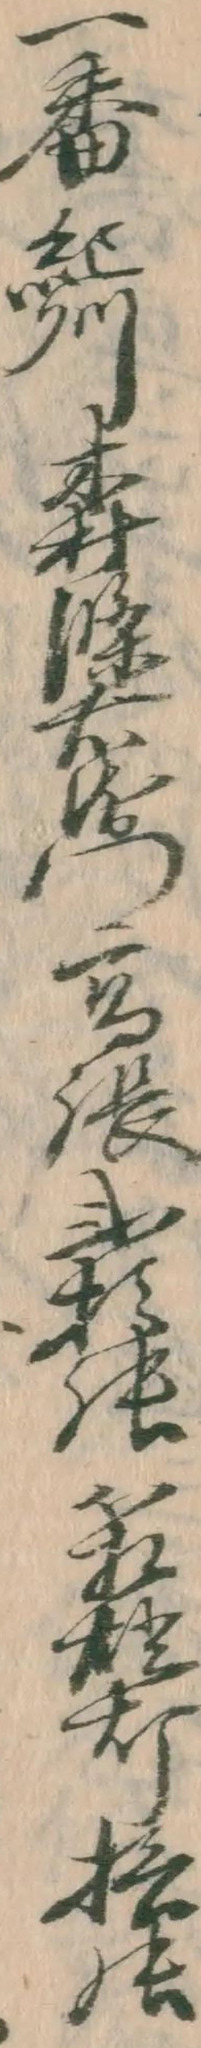一番紀州森條右衛門高張弐拾張箱燈灯拾俵
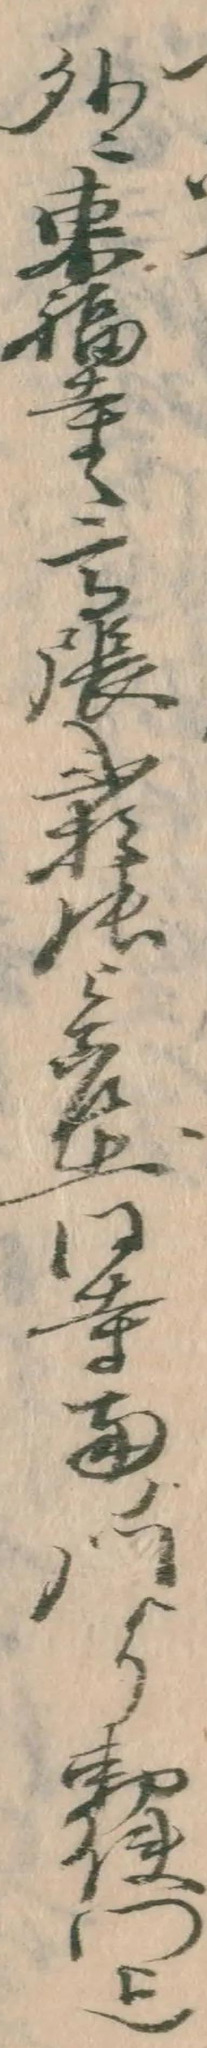外ニ東福寺へ高張弐拾張被差上同寺南ノ門より勅使門迄
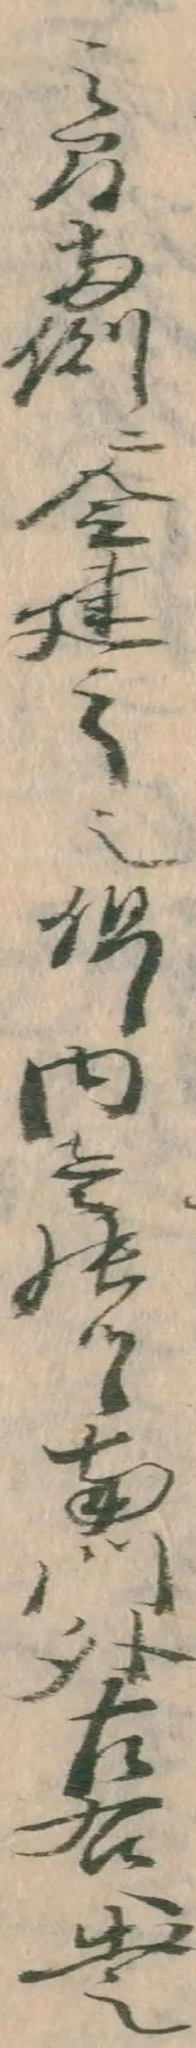之間両側に金建之也但し内壱張候而南門外左右へ出之
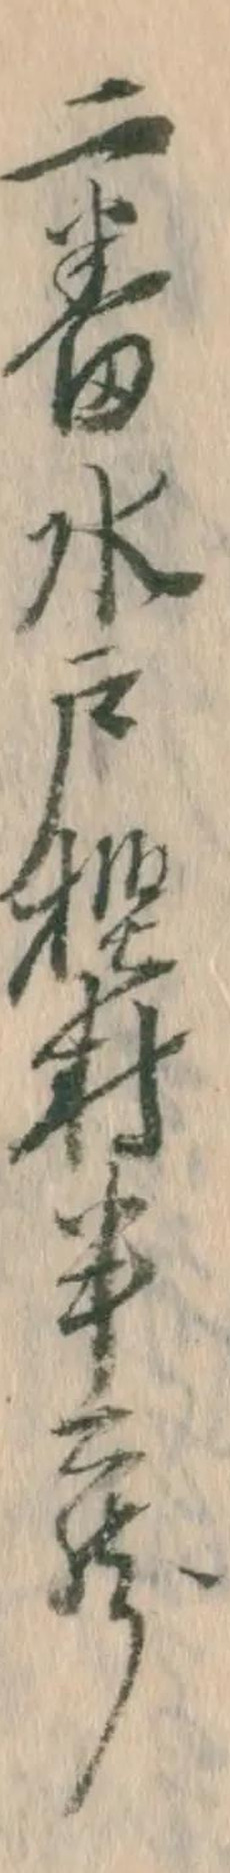二番水戸投村半蔵
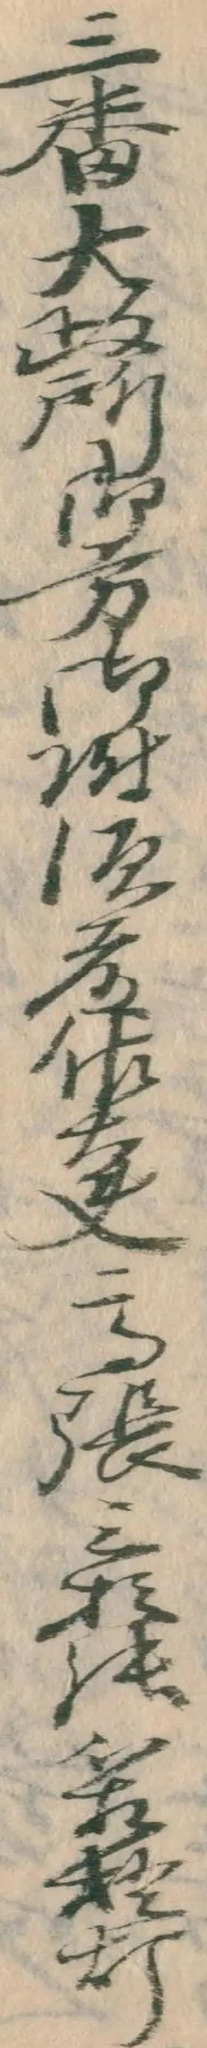三番大政所御方御附須藤佐大夫高張三拾張箱於灯
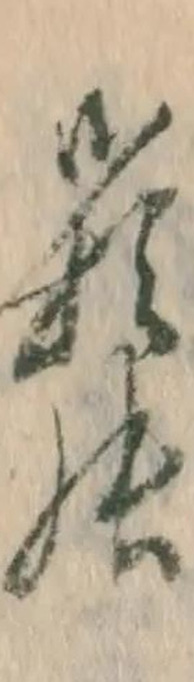弐拾俵
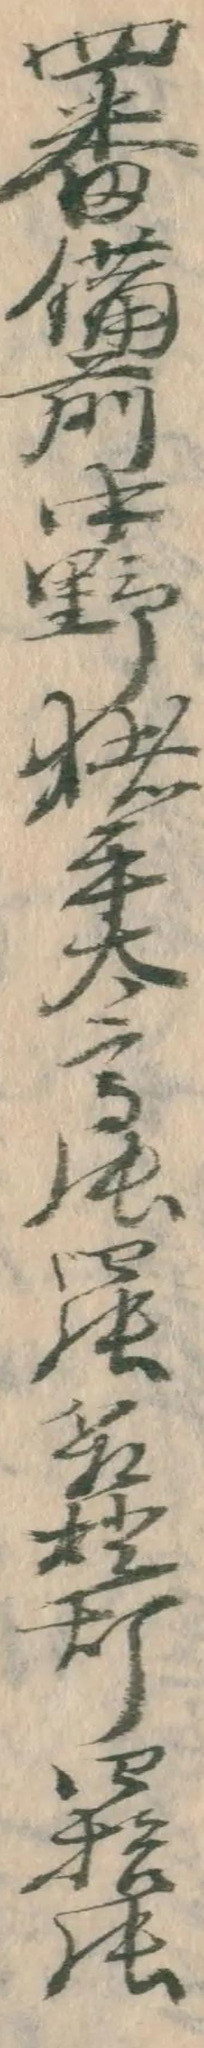四番備前中野猪平太高張四張箱燈灯四拾張
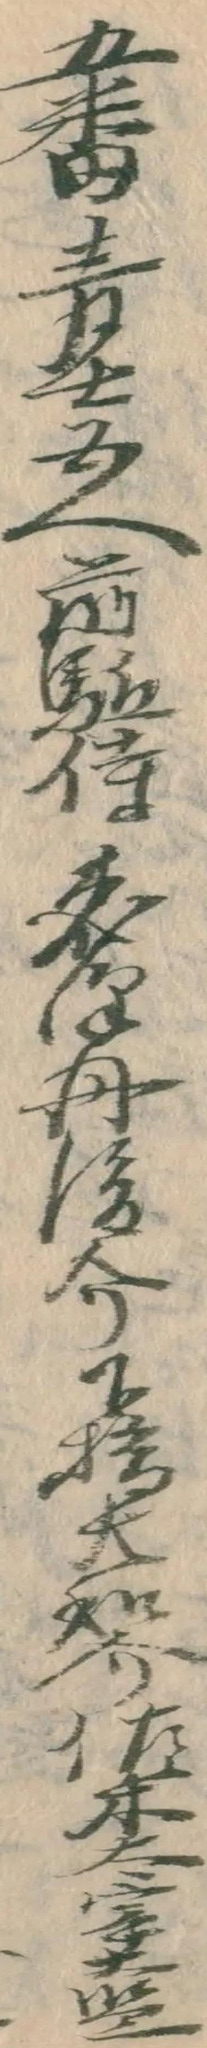五番青士五人前駈侍森沢丹後今下橋大和介佐木大宰大監
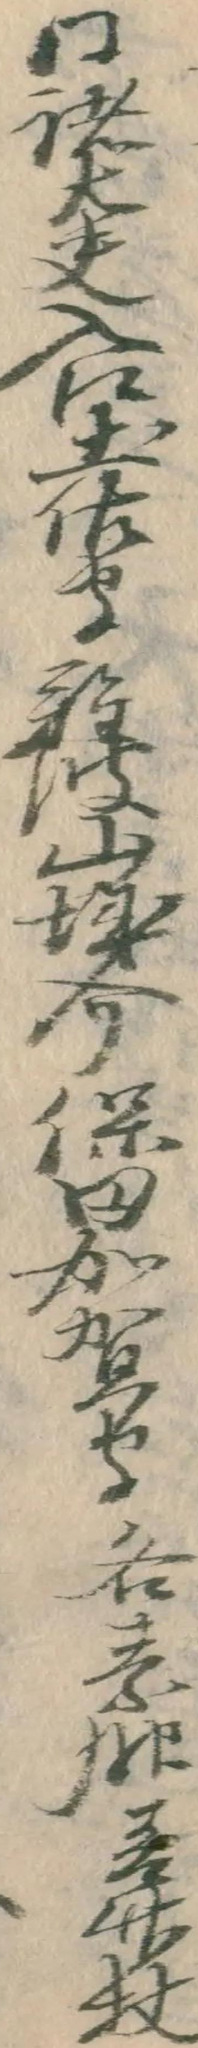同諸大夫入江土佐守難波山城介保田加賀守各素服状杖

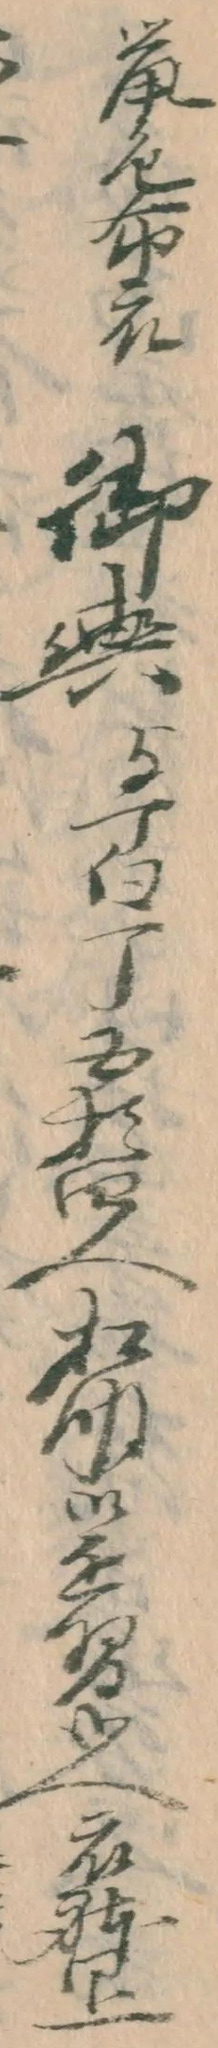鼠色布衣御輿与丁白丁五拾四人松明御近習弐人衣躰同上
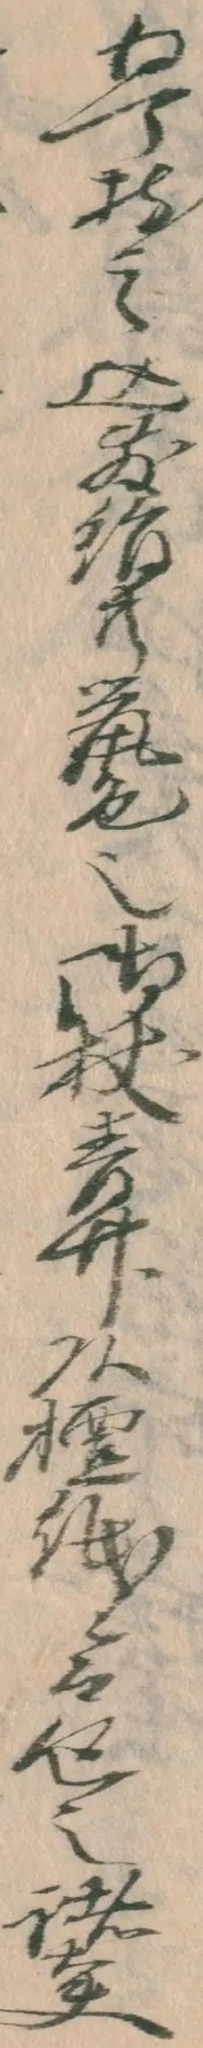白丁持之込敷絹共鼠色也御杖青竹頭檀紙ニ而包之諸大夫
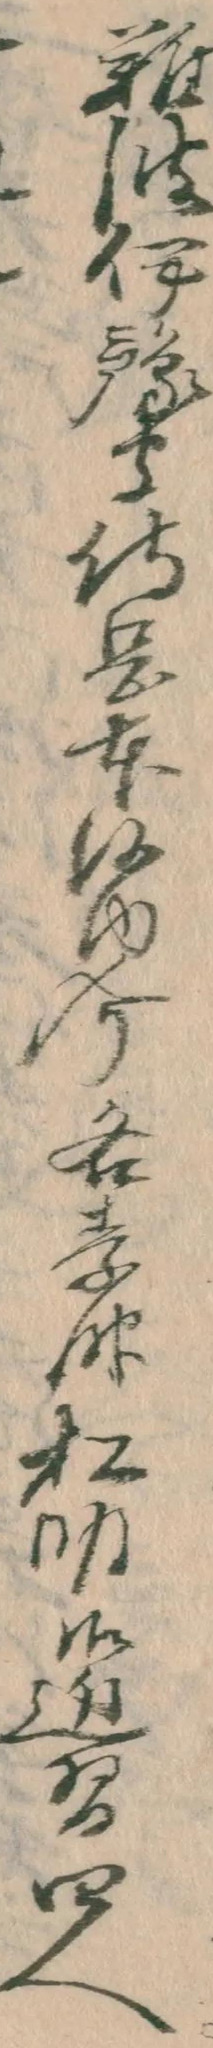難波伊豫守侍岡本河内介各素服松明御近習四人
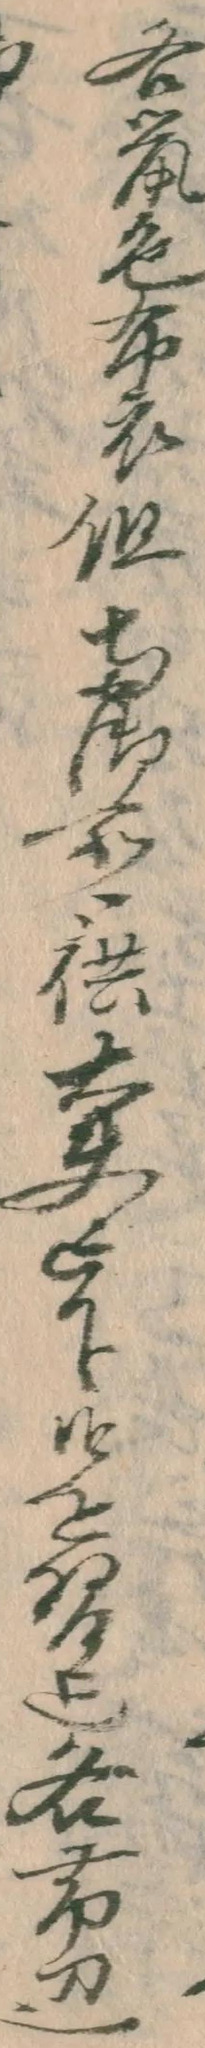各鼠色布衣但両御所御供大夫已下候近習迄各帯刀也
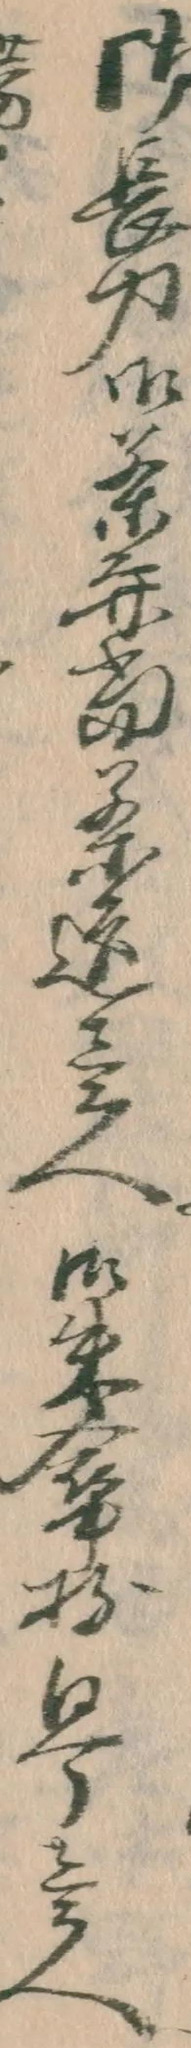御長刀御茶弁當茶道壱人御朱會持白丁壱人
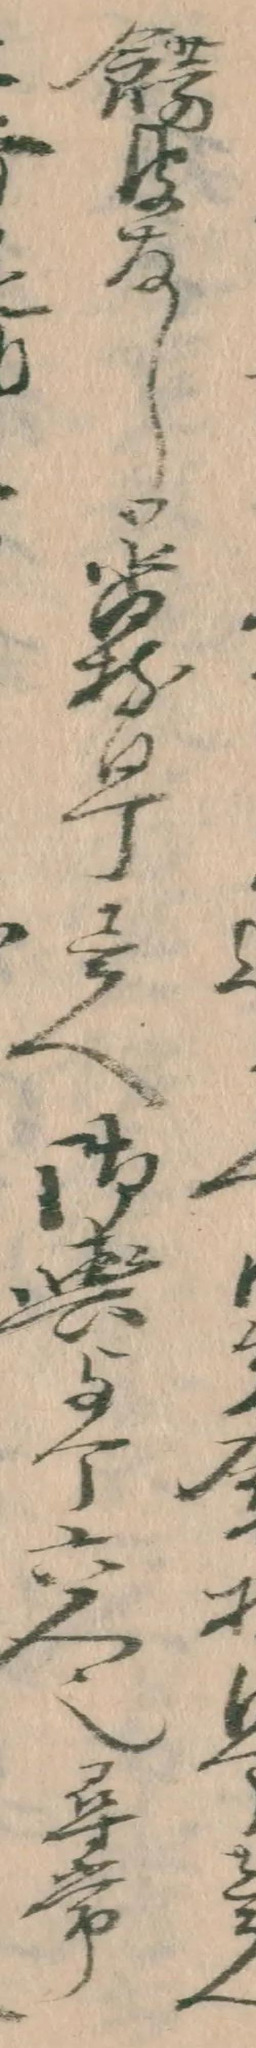餝皮なし御沓持白丁壱人御輿与丁六人也尋常
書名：賀茂社記録. 第67冊
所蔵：国立国会図書館 National Diet Library, JAPAN
